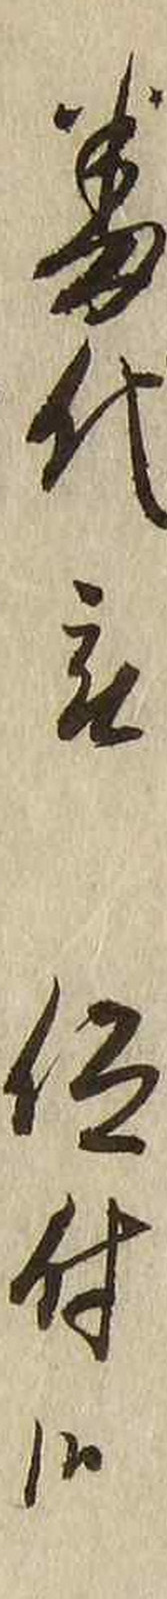番代被仰付候
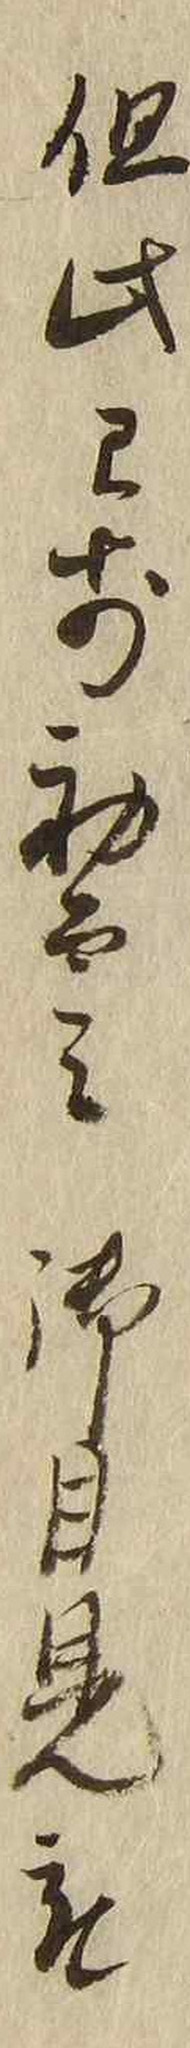但此已前初而之御目見被

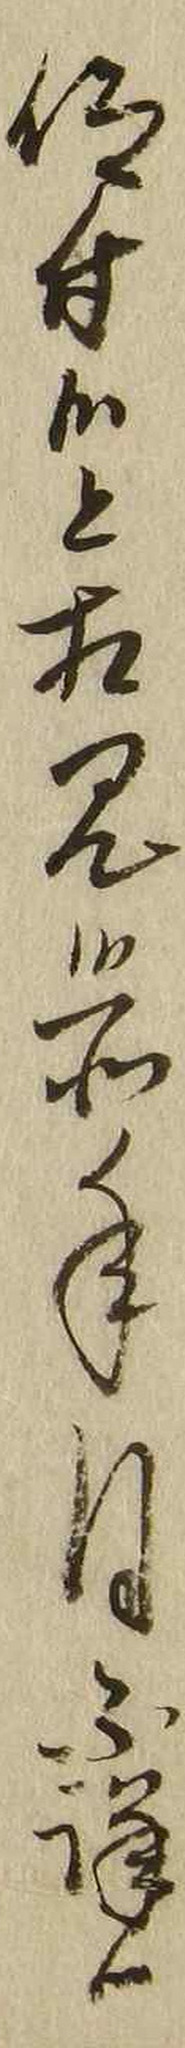仰付候と相見候所年月不詳候
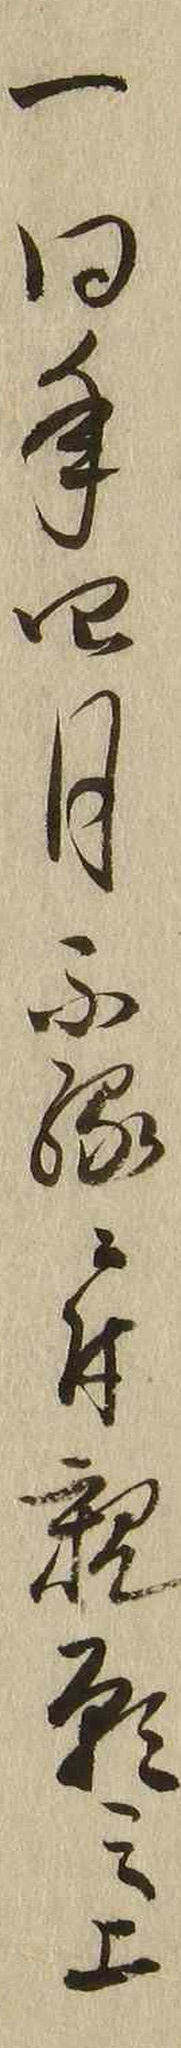一同年四月不縁ニ付親願之上
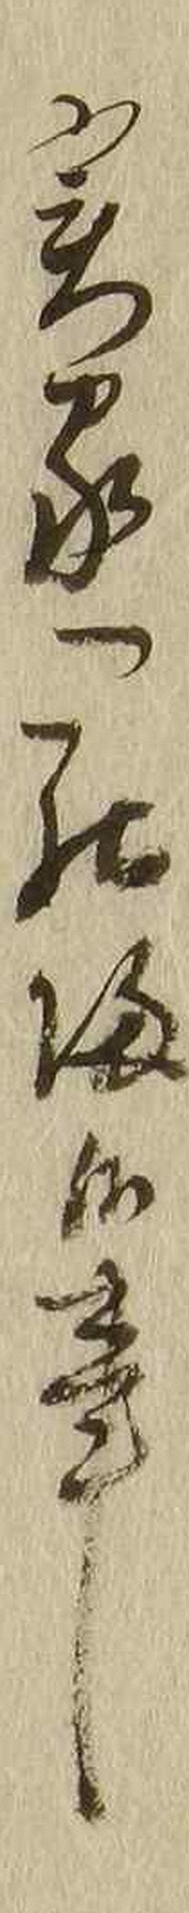実家へ罷帰候事
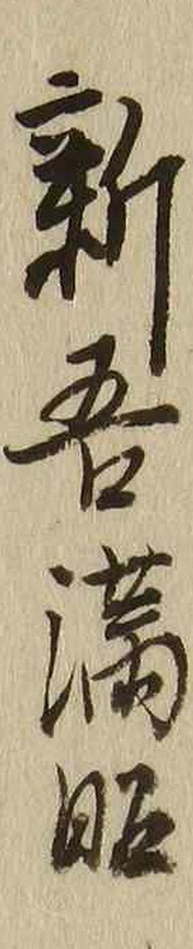新吾満昭
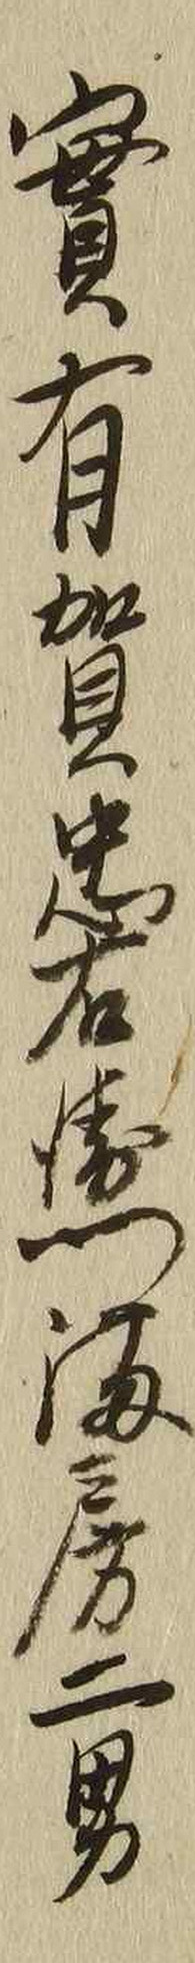実有賀忠右衛門満房二男
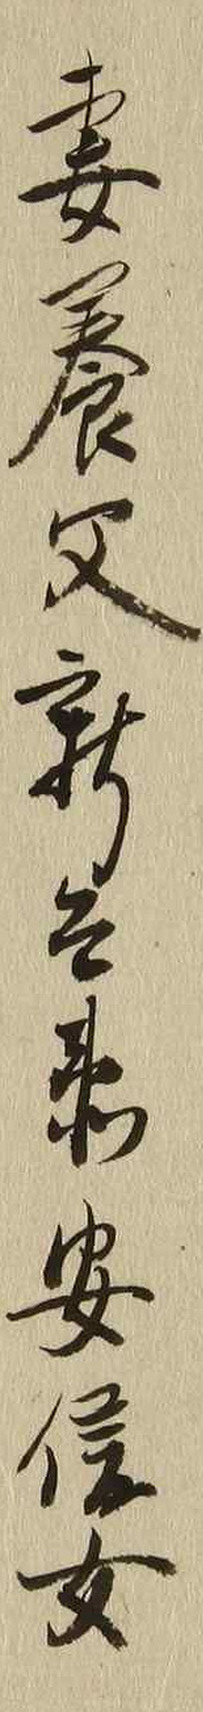妻養父新兵衛安信女
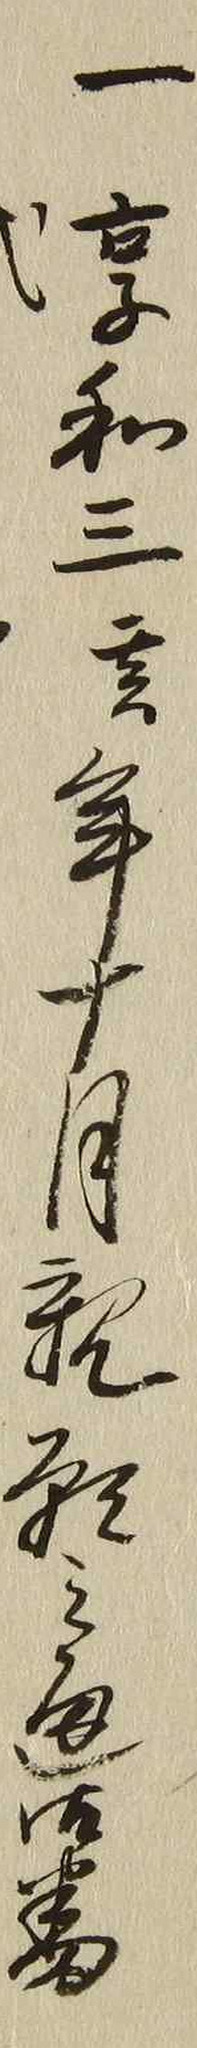一享和三亥年十月親願之通御番
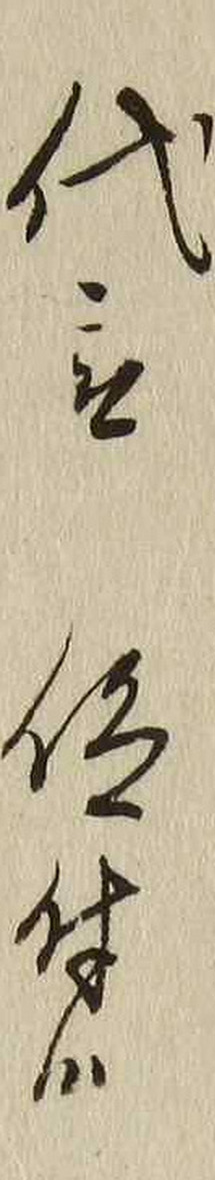代被仰付候
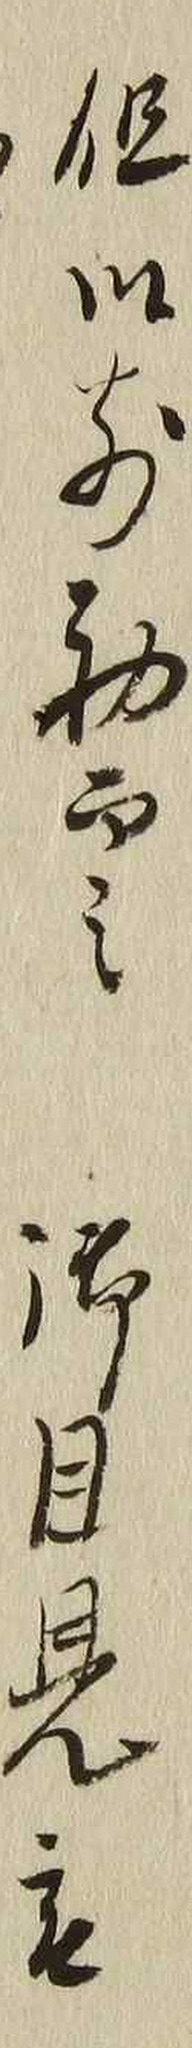但以前初而之御目見被
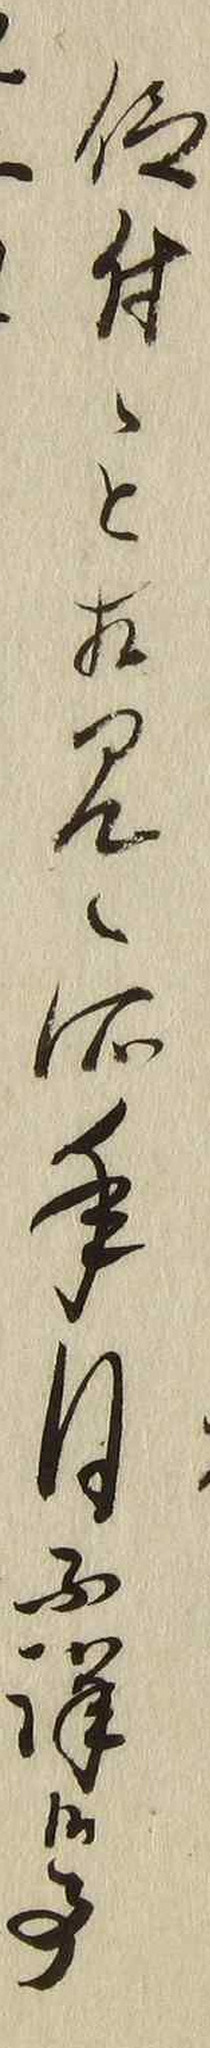仰付候と相見候所年月不詳候事
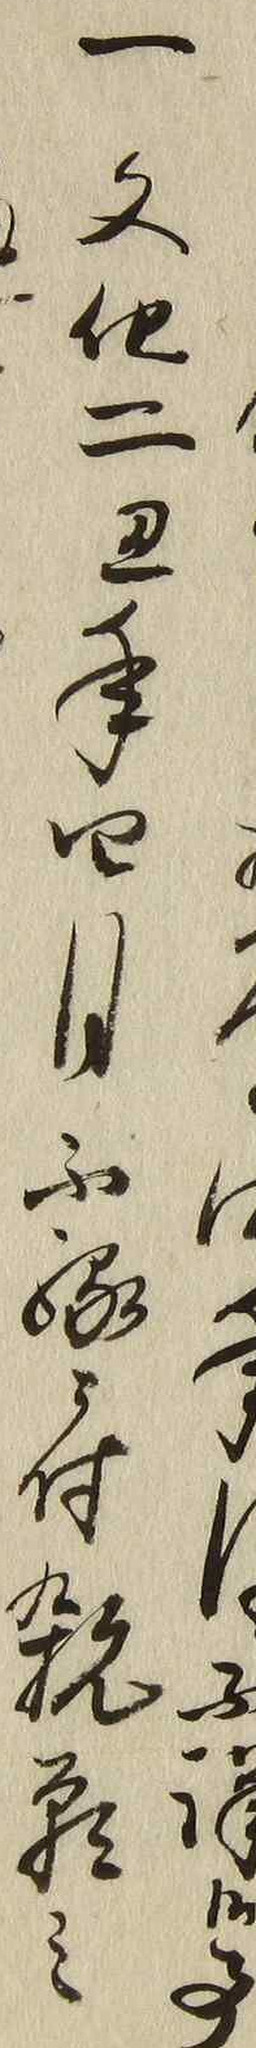一文化二丑年四月不縁ニ付親願之
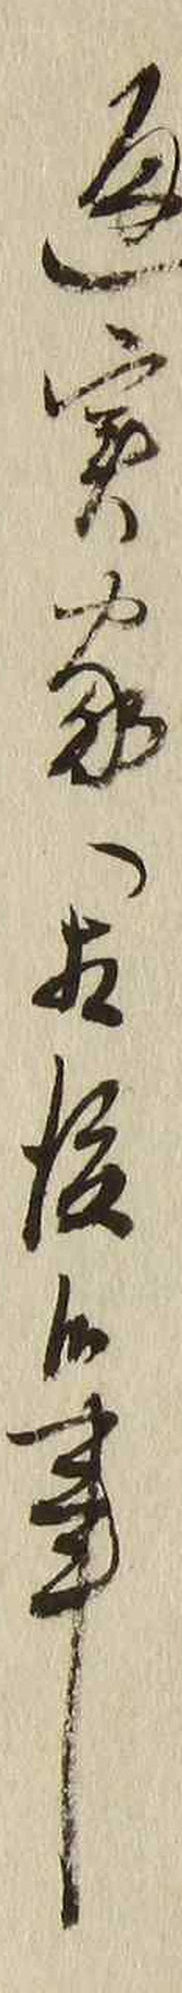通実家へ相渡候事

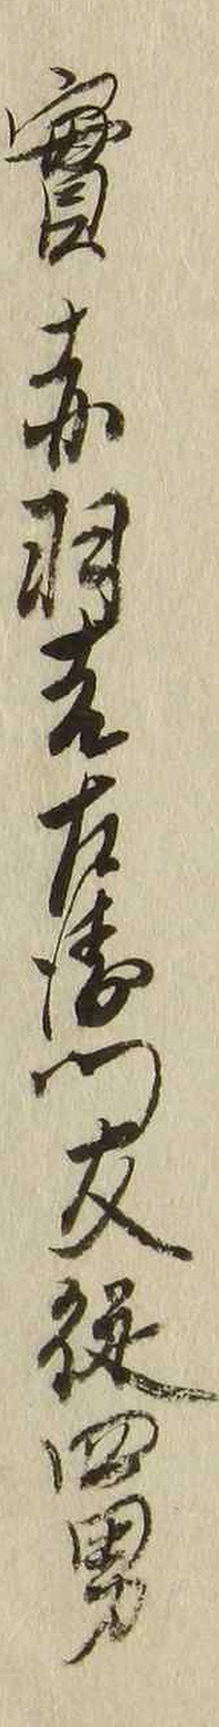実赤羽吉左衛門友従四男
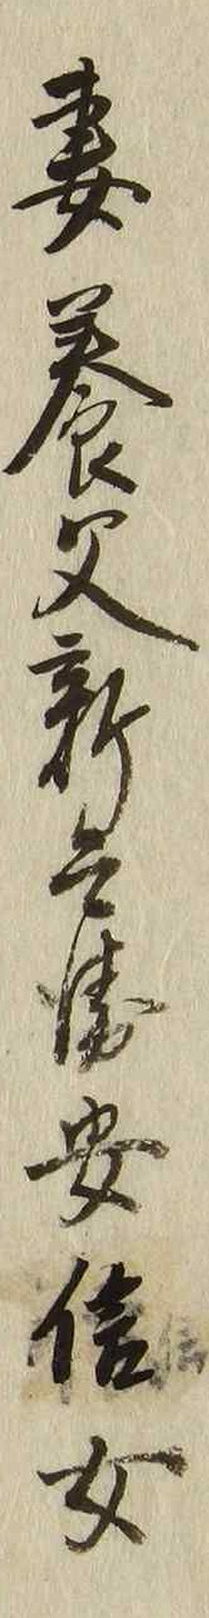妻養父新兵衛安信女
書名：諸士系譜　巻之348　も之部4
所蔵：会津若松市立会津図書館
